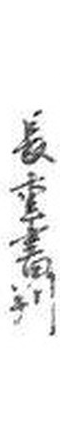長重書判
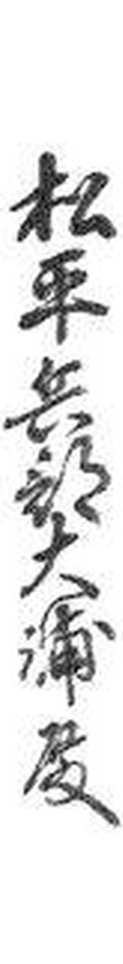松平兵部大輔殿
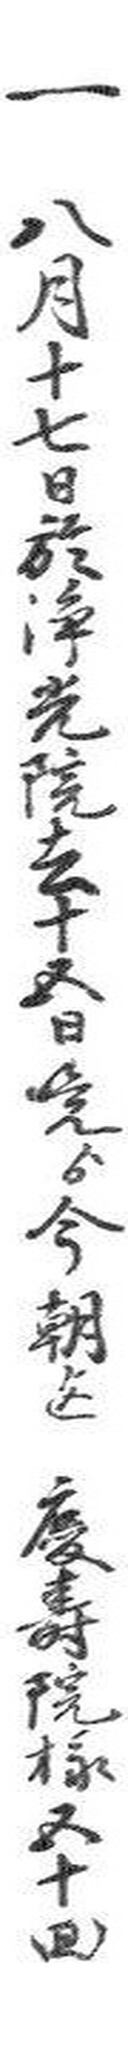一八月十七日於浄光院去十五日晩ゟ今朝迄慶寿院様五十回
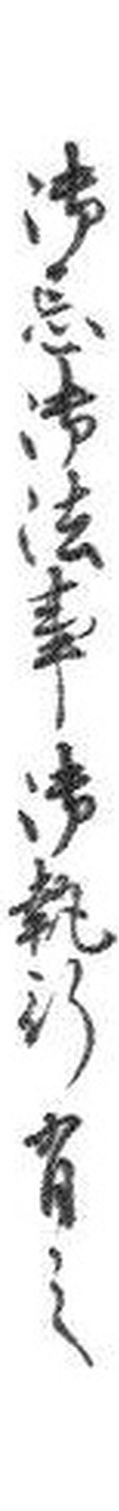御忌御法事御執行有之
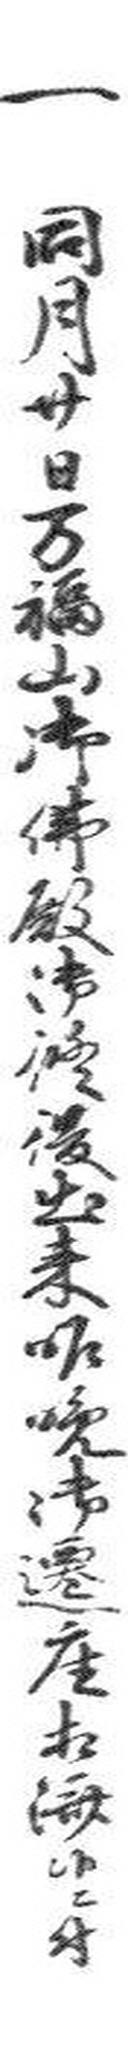一同月廿日万福山御仏殿御修復出来昨晩御遷座相済候ニ付
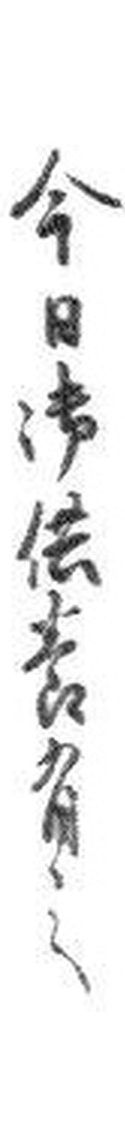今日御供養有之
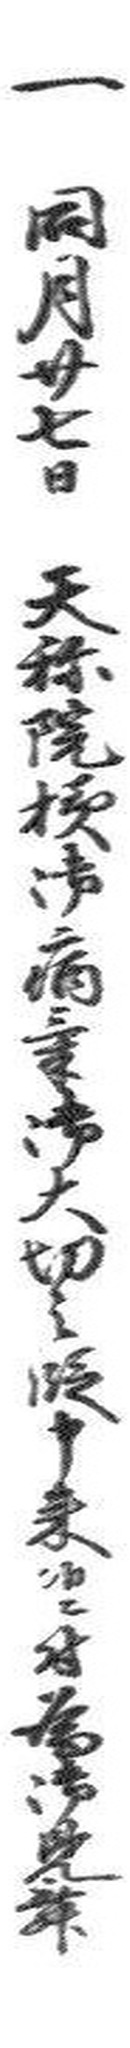一同月廿七日天称院様御病気御大切之段申来候ニ付為御見舞
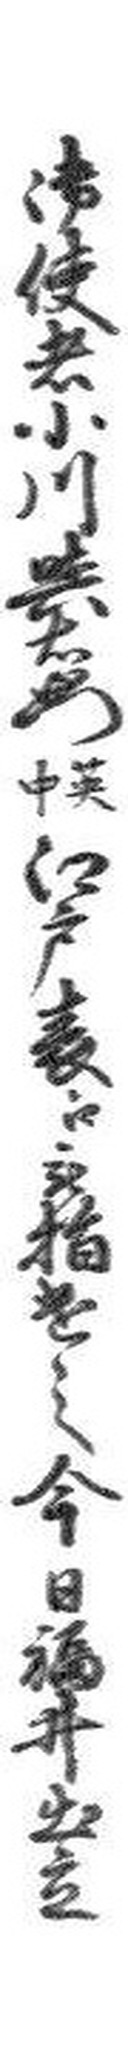御使者小川与右衛門英中江戸表江被指遣之今日福井出立
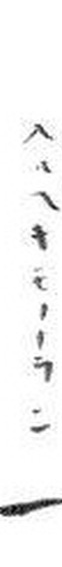入ルヘキモノナラン
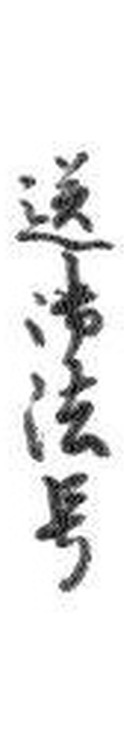送御法号
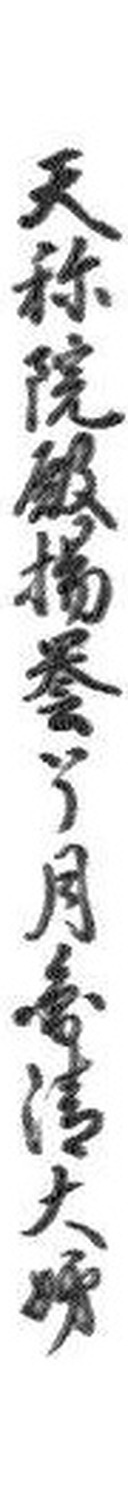天称院殿揚誉了月円清大姉
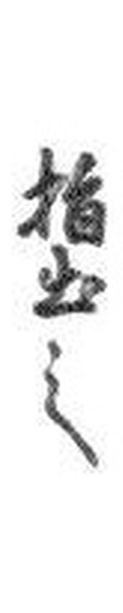指出之
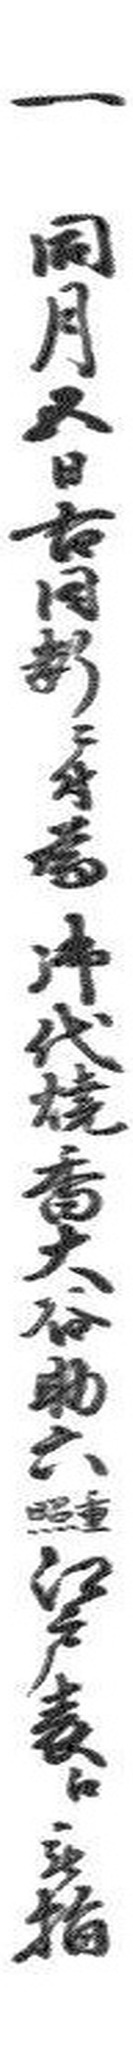一同月五日右同断ニ付為御代焼香大谷助六重照江戸表江被指

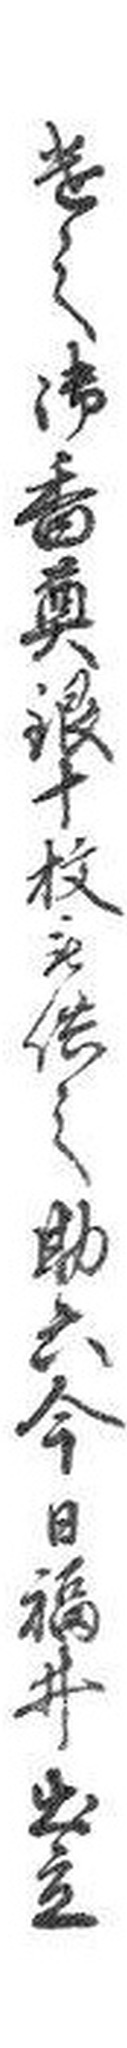遣之御香奠銀十枚被供之助六今日福井出立
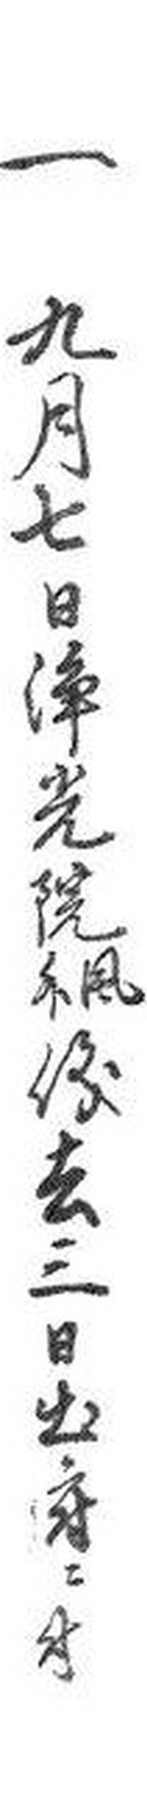一九月七日浄光院風外儀去三日出府ニ付
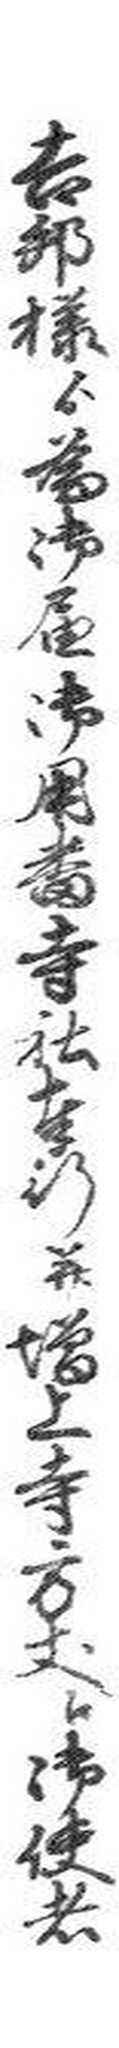吉邦様ゟ為御届御用番寺社奉行并増上寺方丈江御使者
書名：家譜 二十四 吉品公 従宝永三年到同五年
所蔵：福井県文書館 Fukui Prefectural Archives
